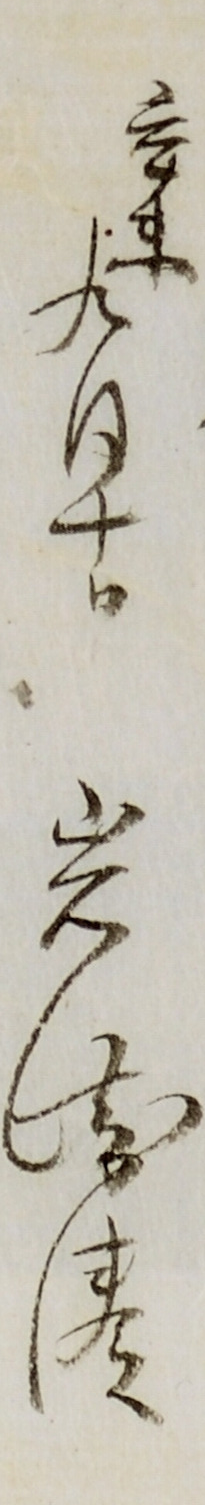九月十日岩崎湊
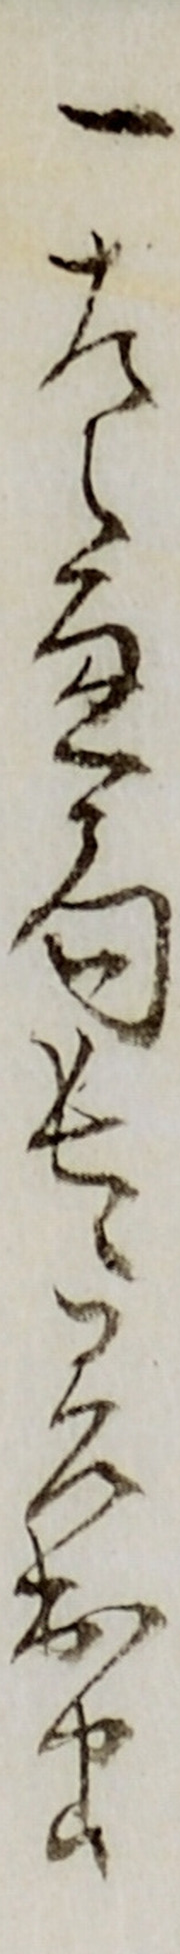一左之通局長へ差出申候
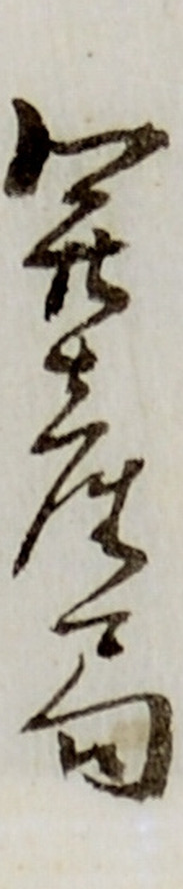開産局
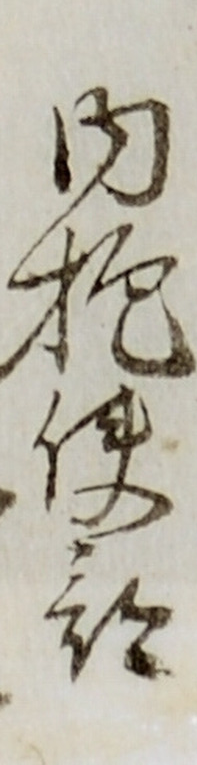内抱使部
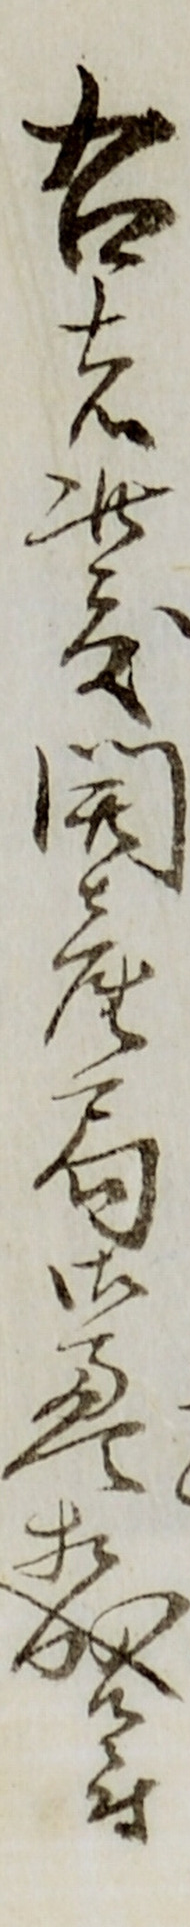右は此度開産局御畳相成候に付
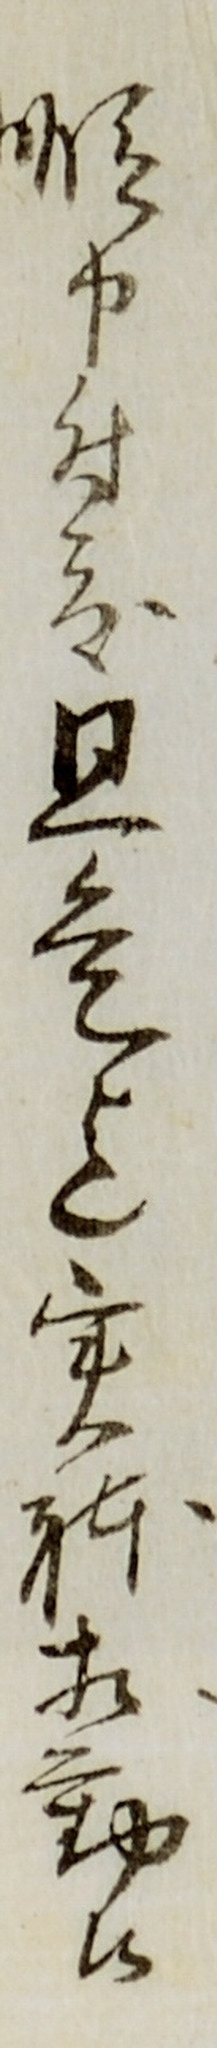暇申付度且是迄実体相勤候
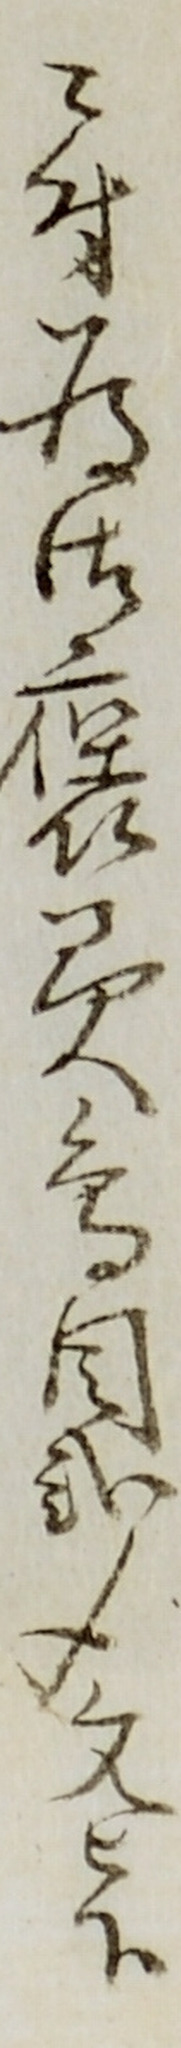に付為御褒美鳥目弐貫文被下
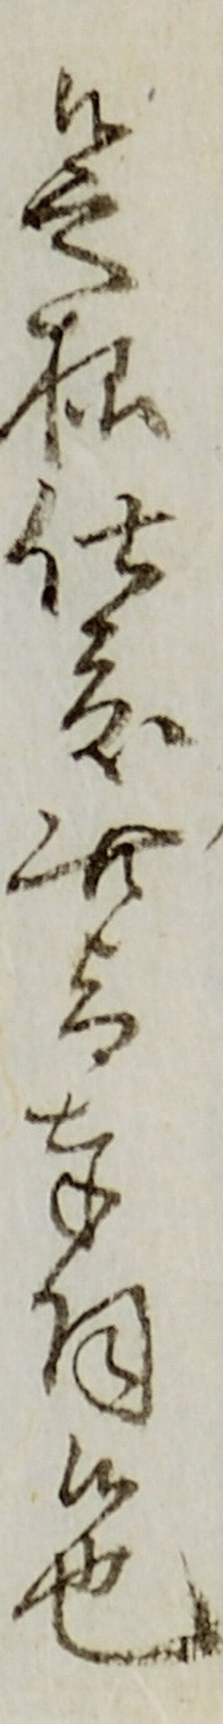候之様仕度此旨奉伺候也
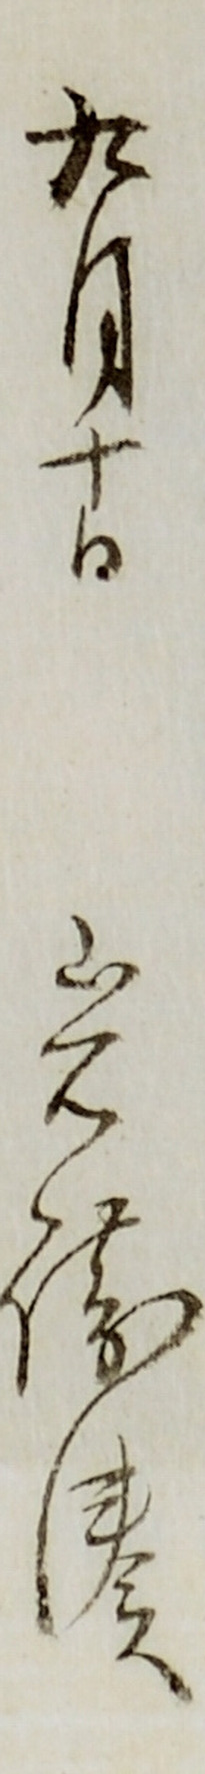九月十日岩崎湊
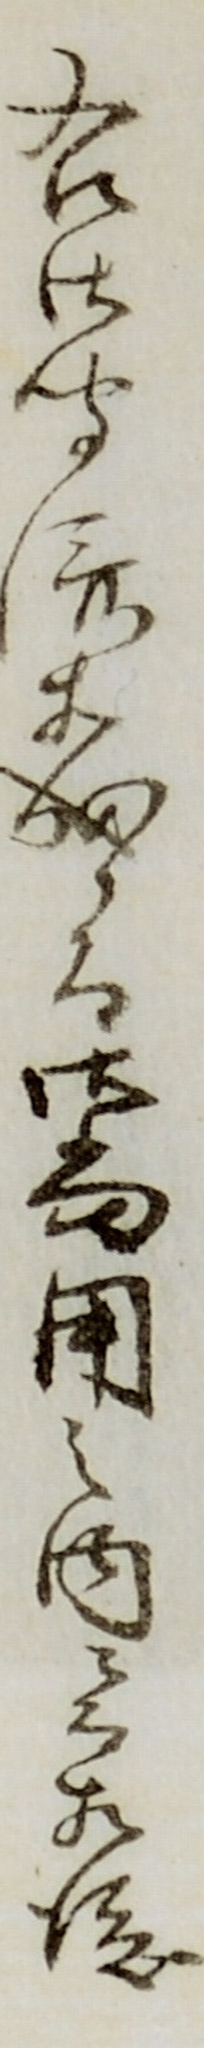右御聞済相成候間御当用之内にて相渡
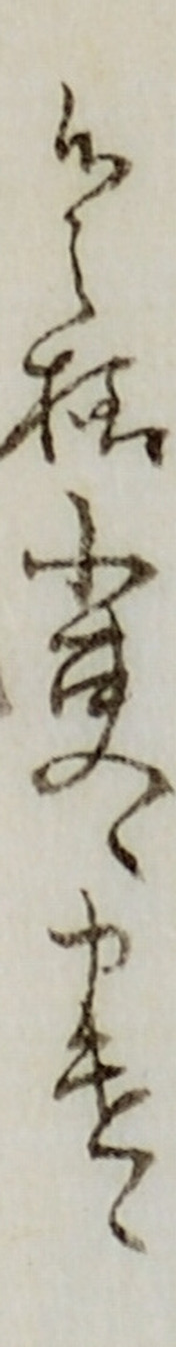候之様小吏へ申遣候
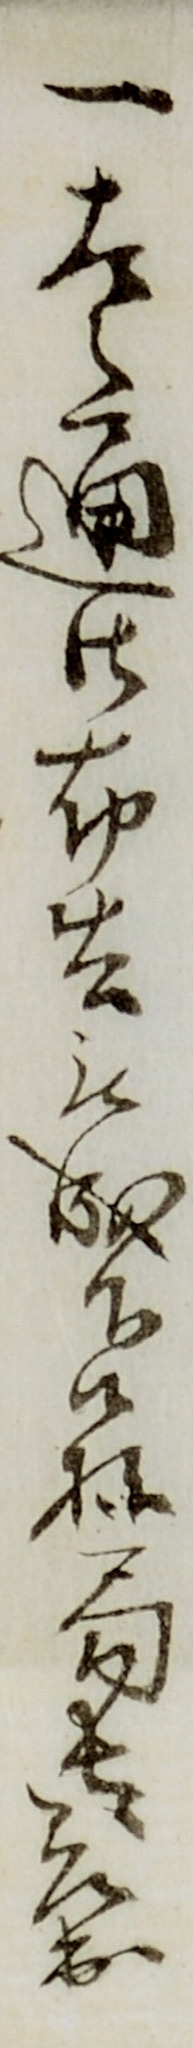一左之通御布告被成下候様局長へ差出
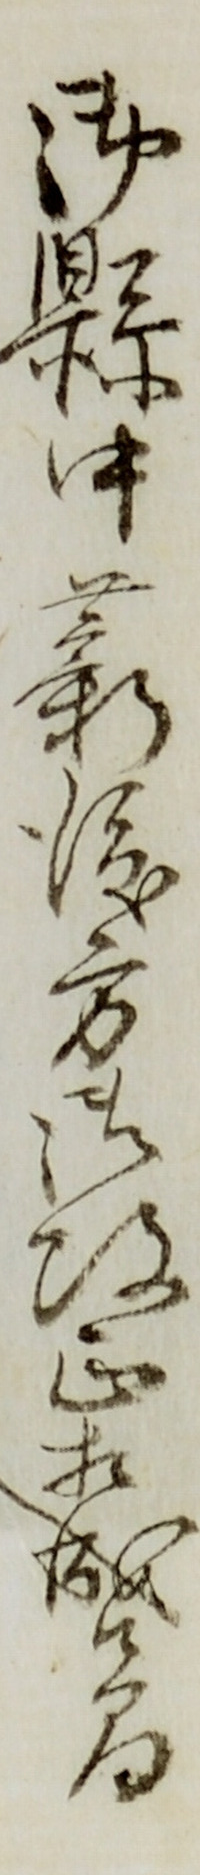御県中薪渡方御改正相成候間
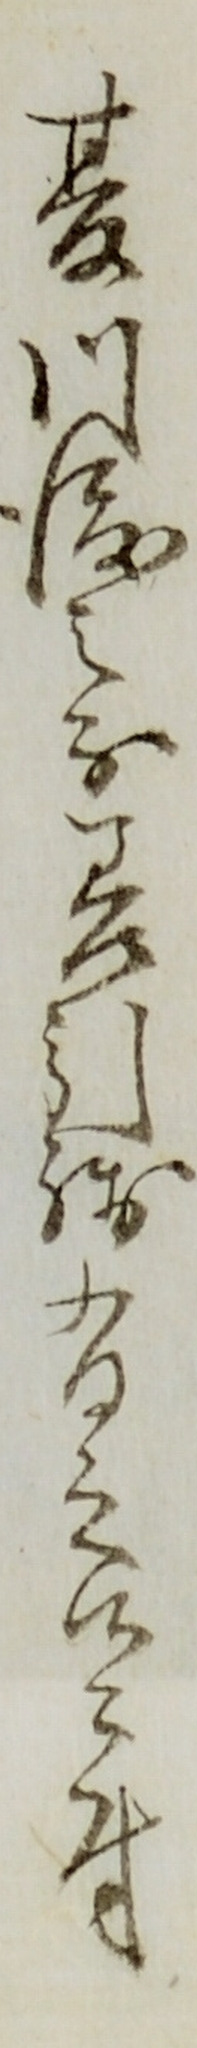夏川渡之分差引残有之候に付
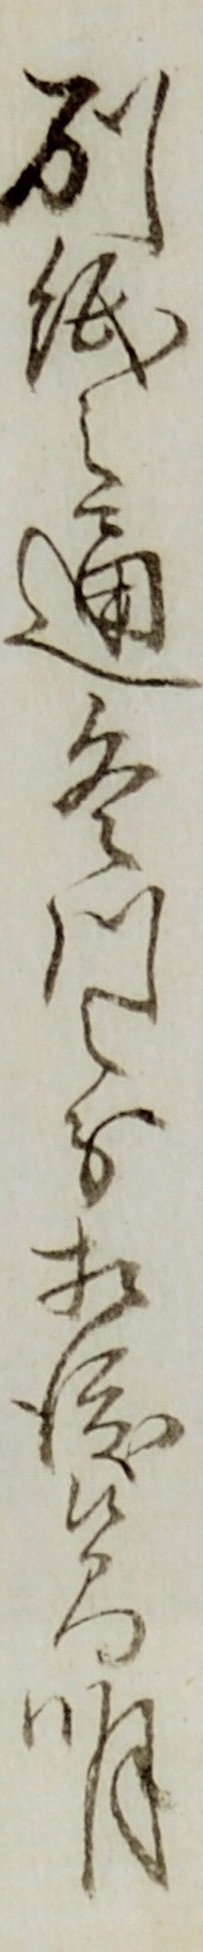別紙之通冬川之分相渡明
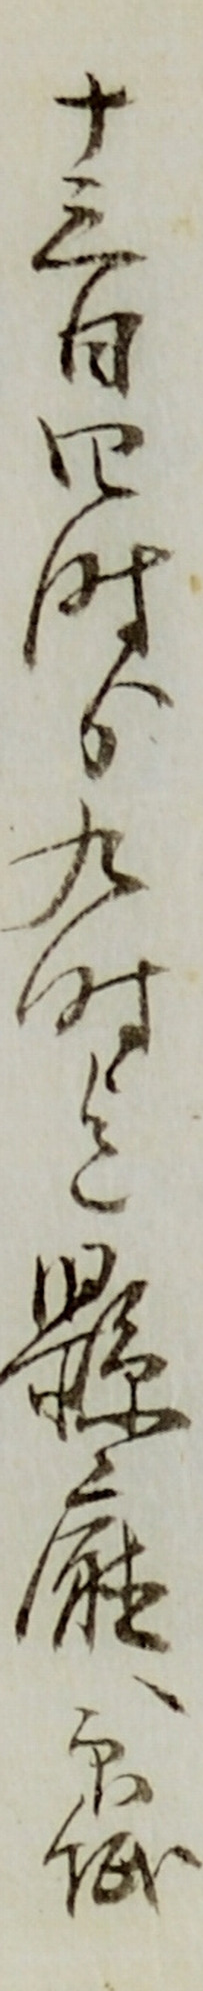十三日四時ゟ九時迄県庁へ印紙
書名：山林方諸事御用留
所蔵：伊那市立高遠町図書館・合同会社AMANE
